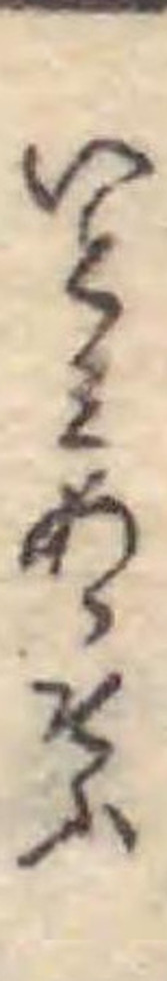いとみあらそふ
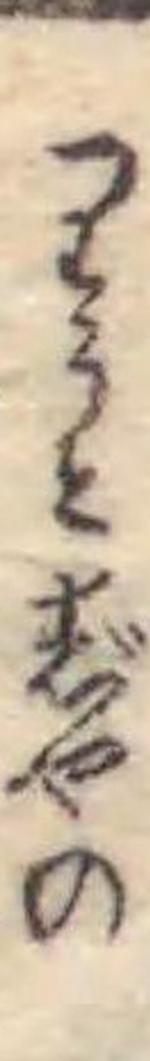りうとじやの
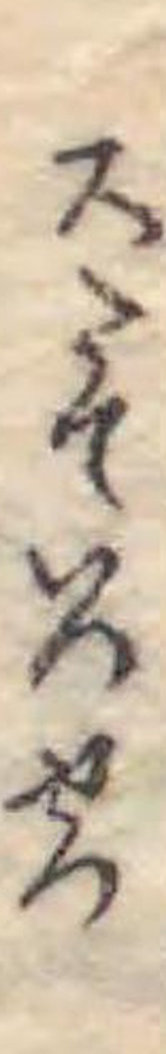大たていつせつ
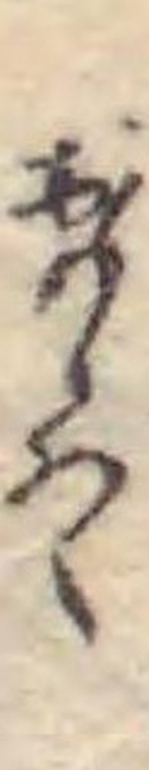おもしろく
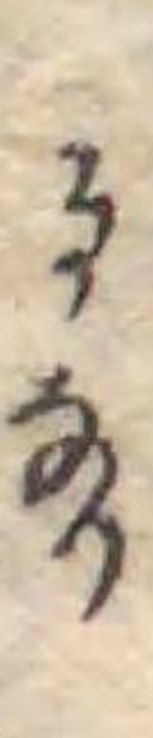事なり
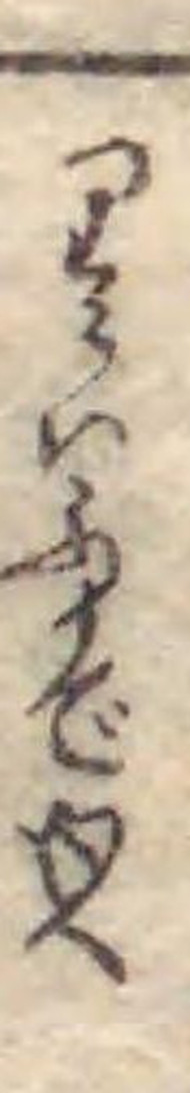りうはふかでゆへ
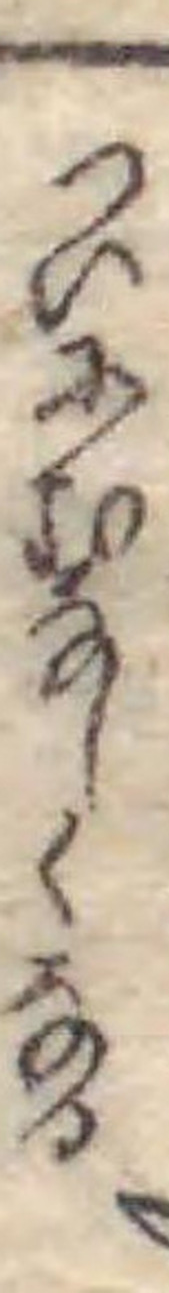ついにむなしくなる
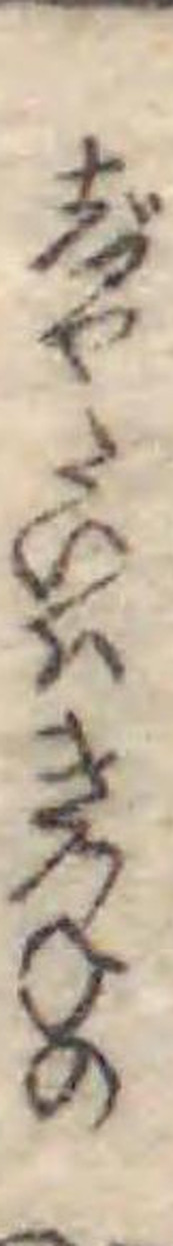じやたいはきつねの
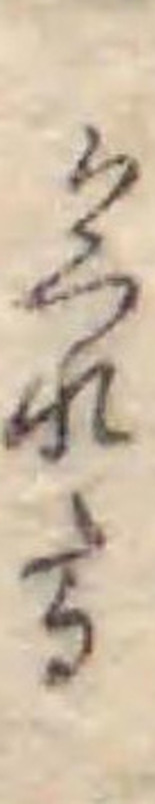かくれたる
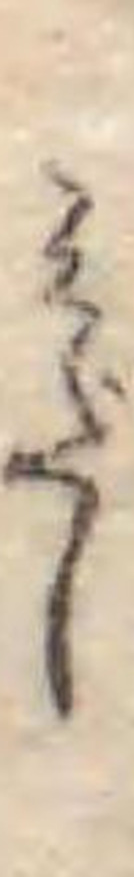みだし
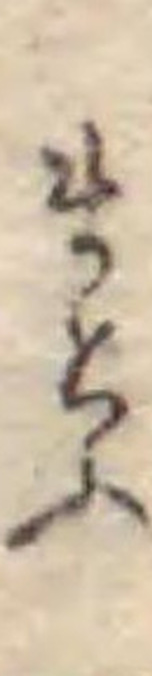まとふ

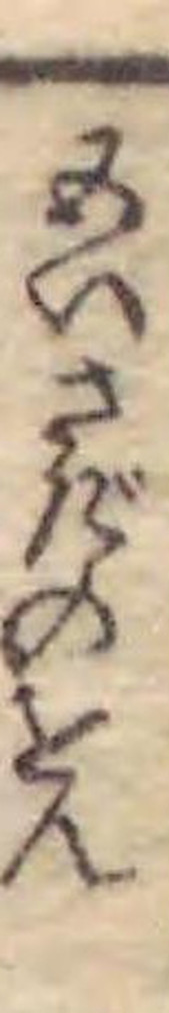五いさぎのをん
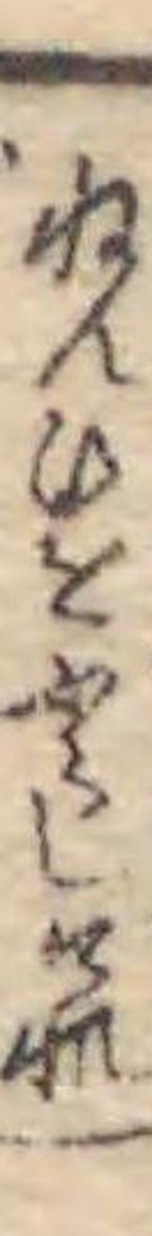ねんひをふらしけれ
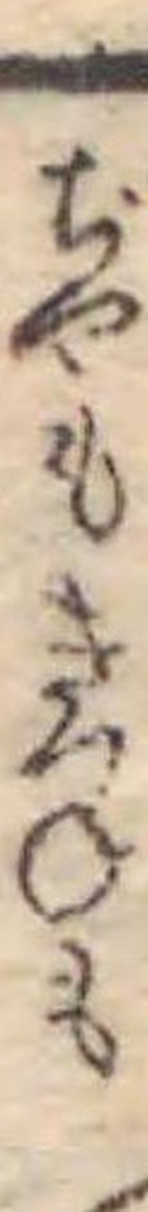ぢやもきつねも
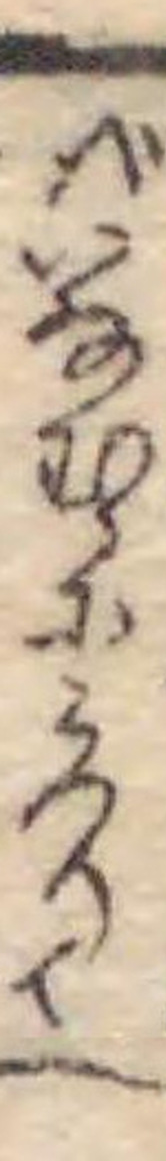ばいなむらにうつりて
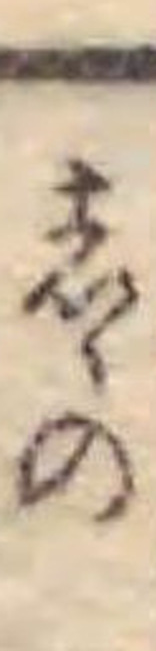しゝの
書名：鐘入七人化粧 : 3巻
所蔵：国立国会図書館 National Diet Library, JAPAN
